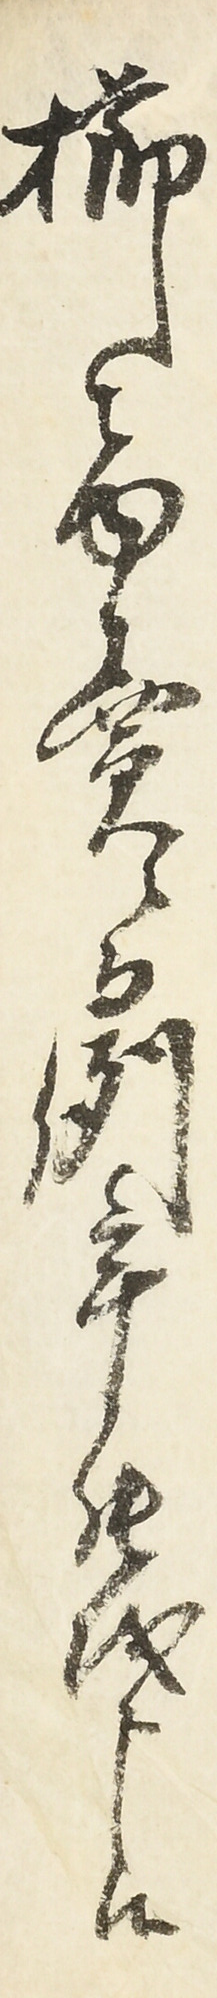櫛し商売ニ而例年罷越申候
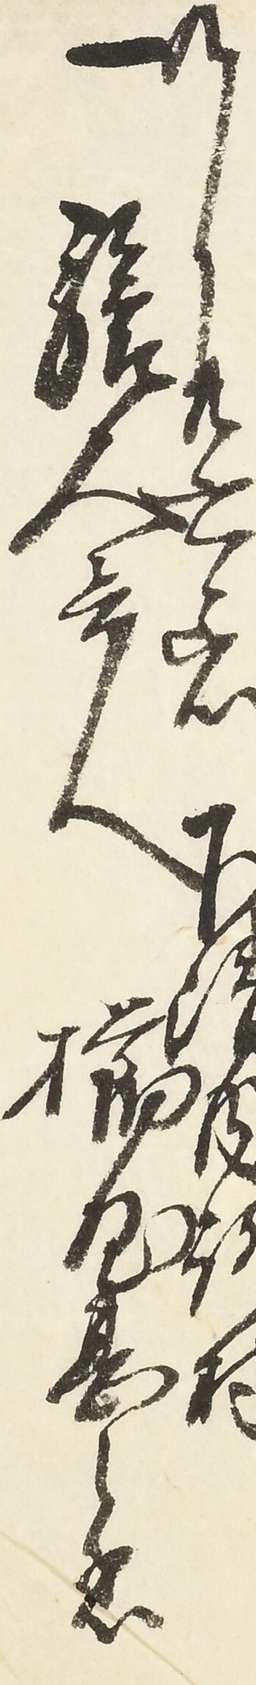一旅人壱人櫛屋甚兵衛

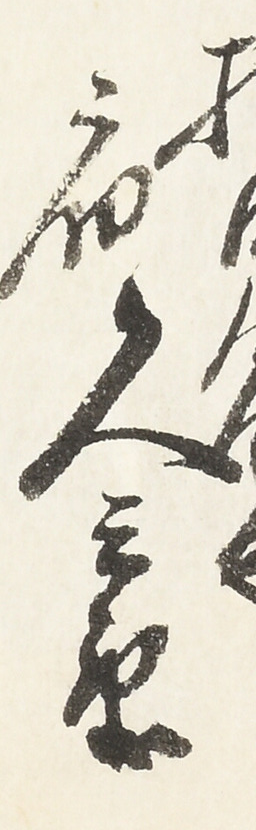宿久兵衛
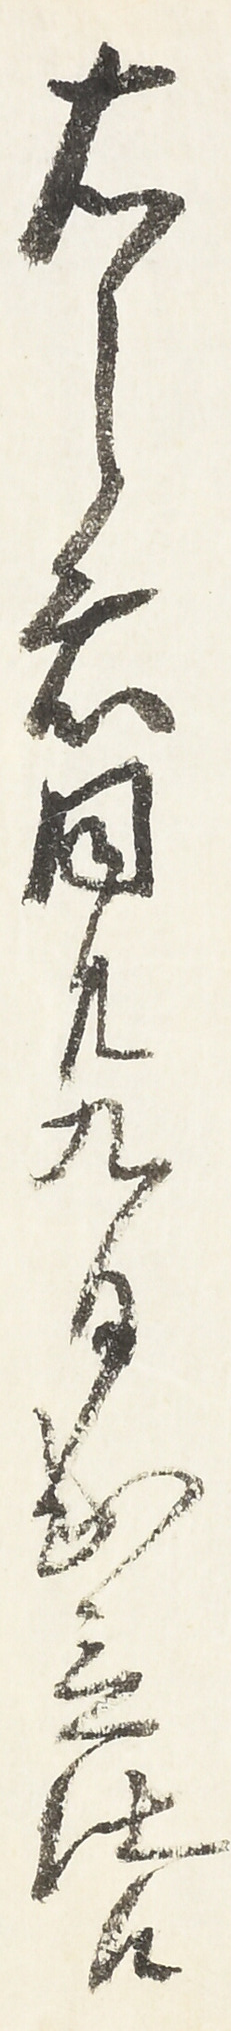右之者同廿九日出立仕候
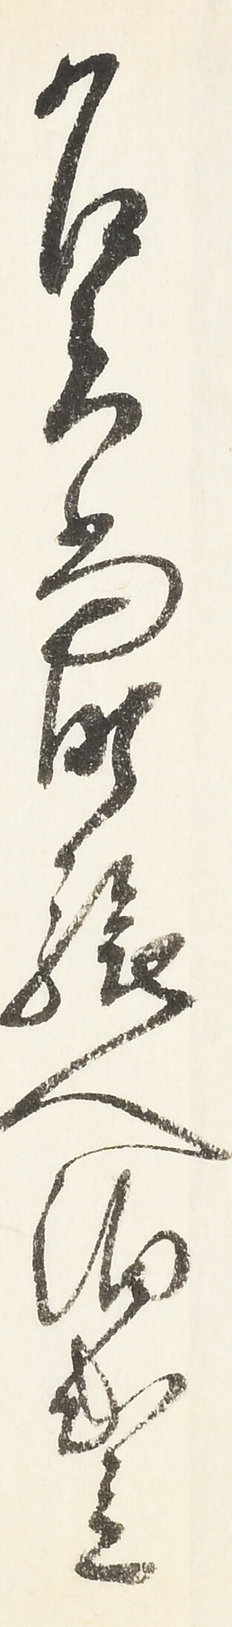右者当町旅人泊出立
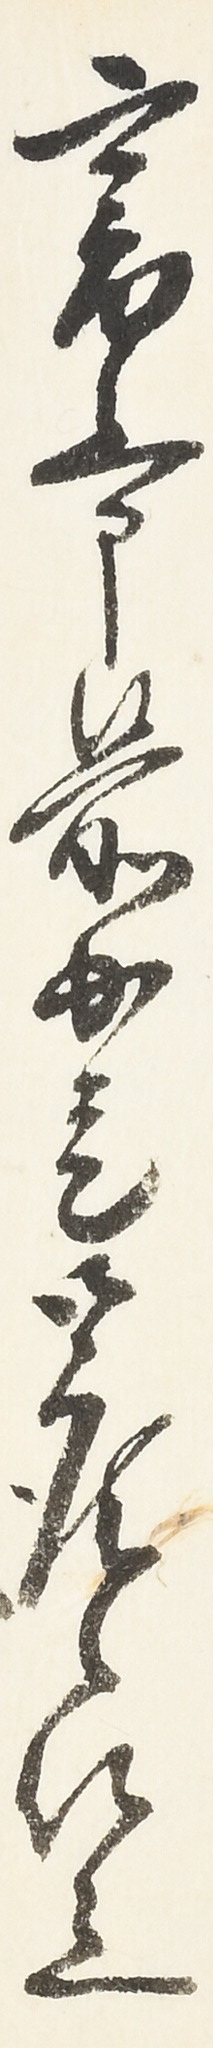書上申候所如是御座候以上
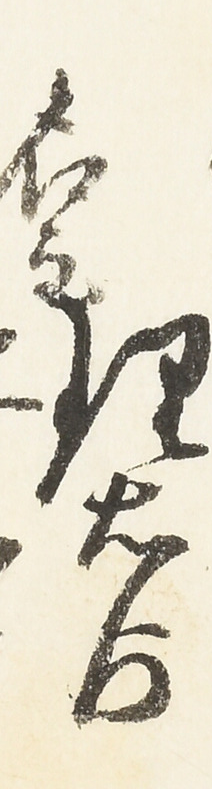酉理右衛門
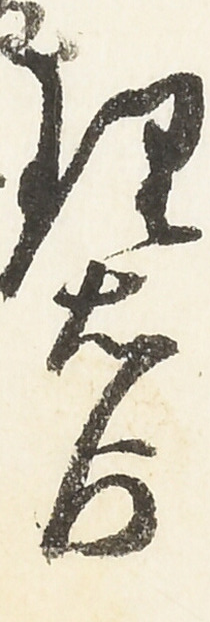酉理右衛門
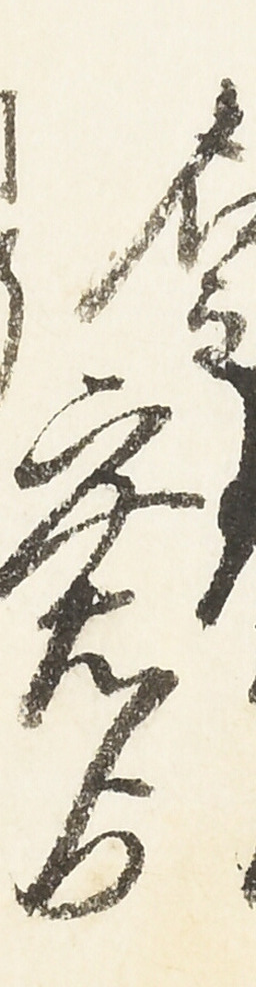平右衛門
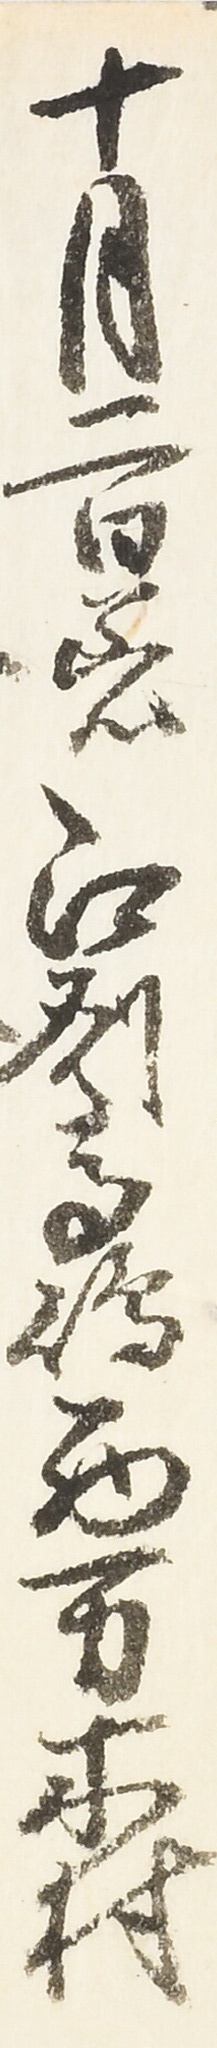十月二日着江州高嶋西万木村
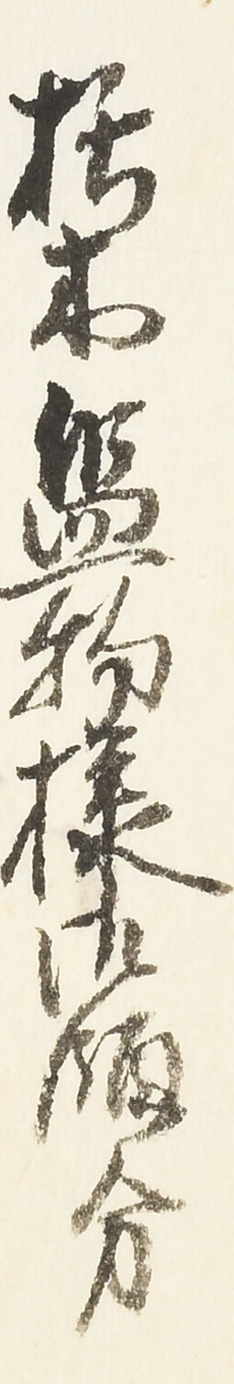朽木監物様御領分
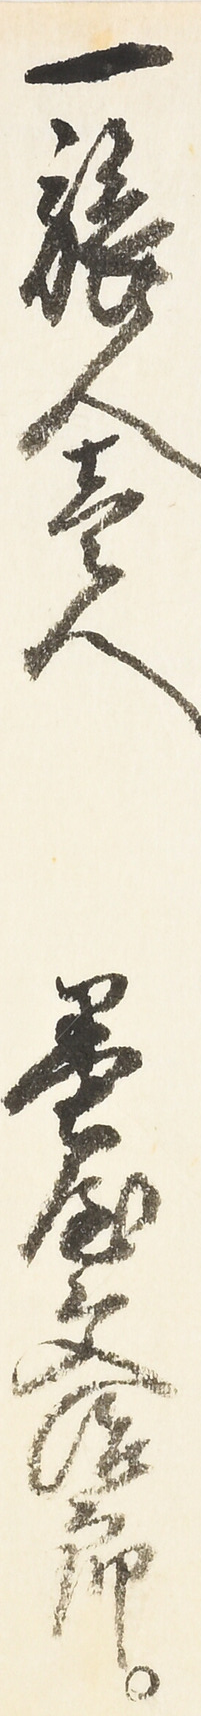一旅人壱人墨屋文治郎。
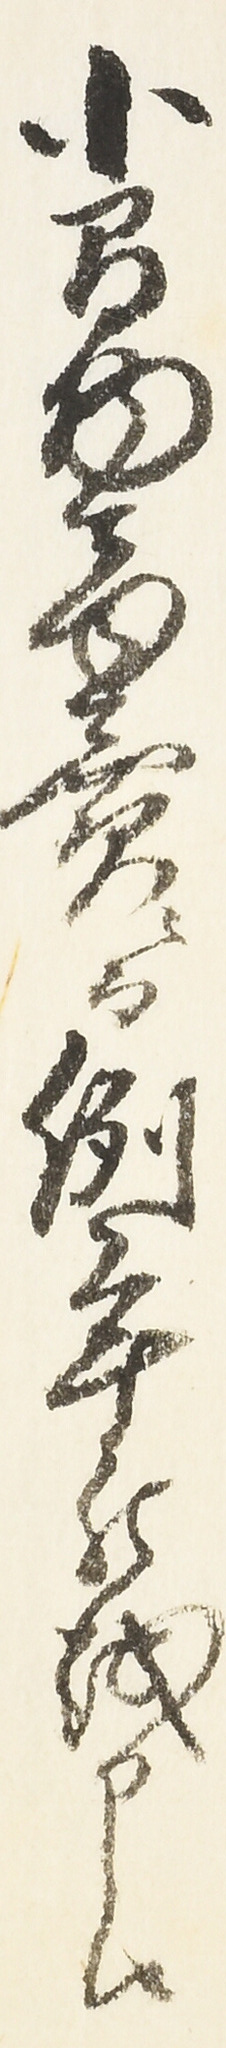小間物商売ニ而例年罷越申候
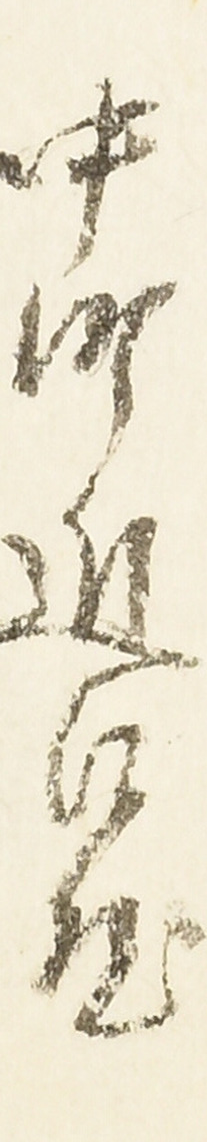中町近江屋
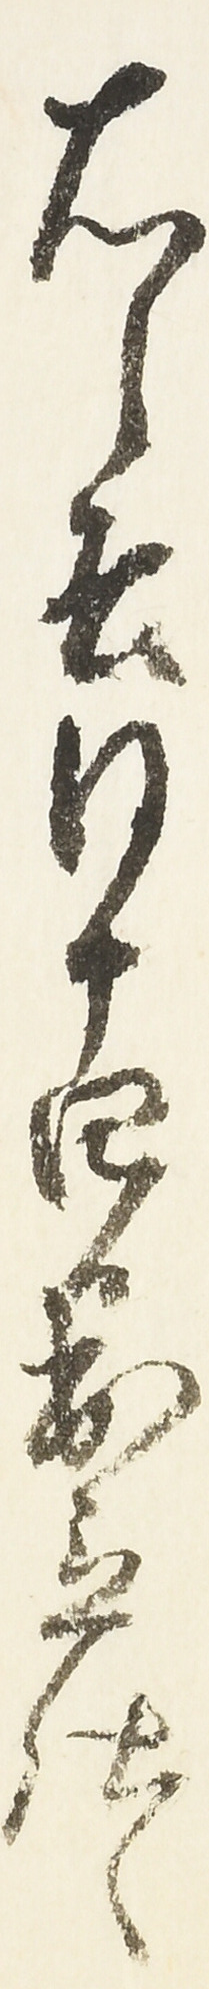右之者同十四日出立仕候
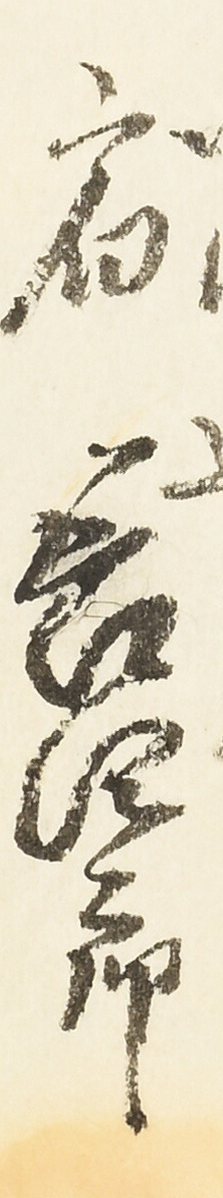宿善四郎
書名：町中旅人泊控帳
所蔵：伊那市立高遠町図書館・合同会社AMANE
